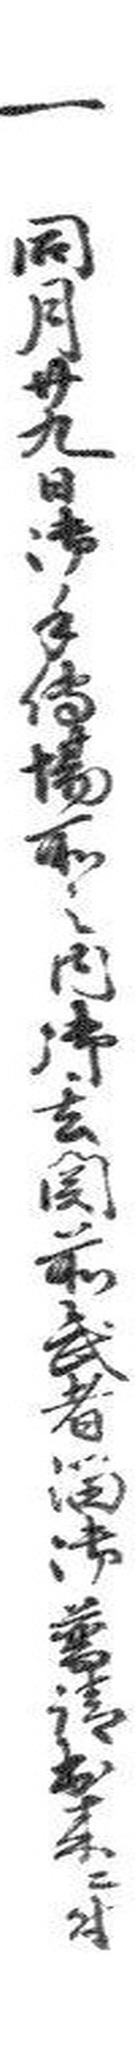一同月廿九日御手伝場所之内御玄関前武者溜御普請出来ニ付
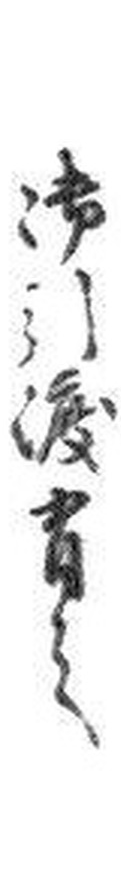御引渡有之
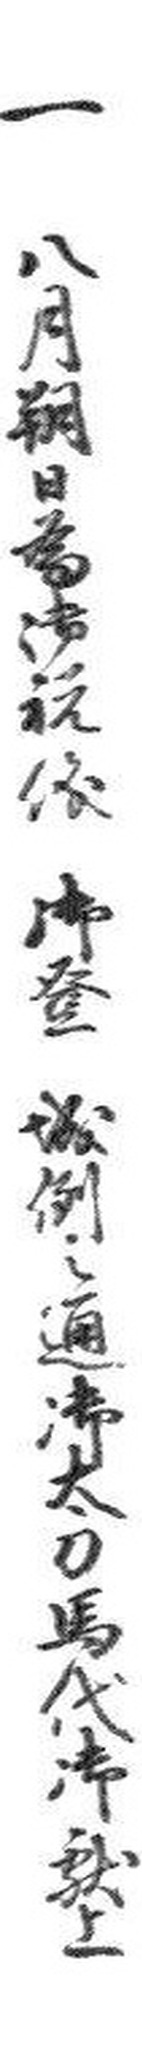一八月朔日為御祝儀御登城例之通御太刀馬代御献上
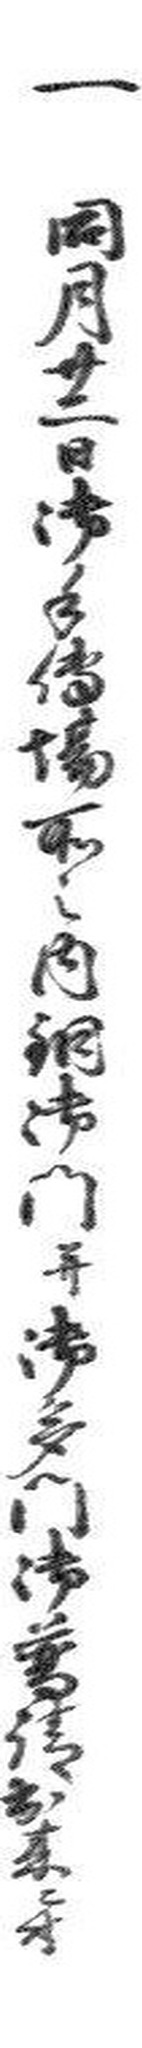一同月廿二日御手伝場所之内銅御門并御多門御普請出来ニ付
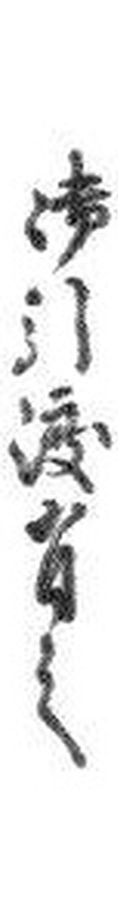御引渡有之
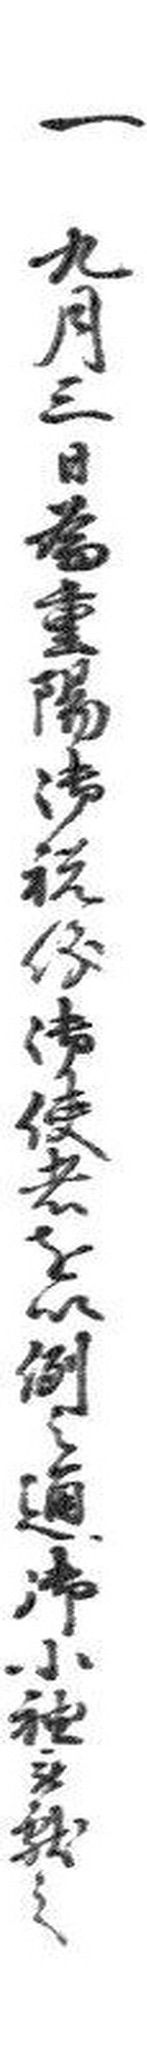一九月三日為重陽御祝儀御使者を以例之通御小袖被献之
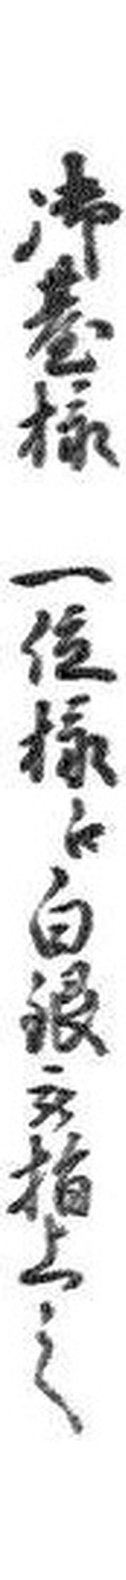御台様一位様江白銀被指上之
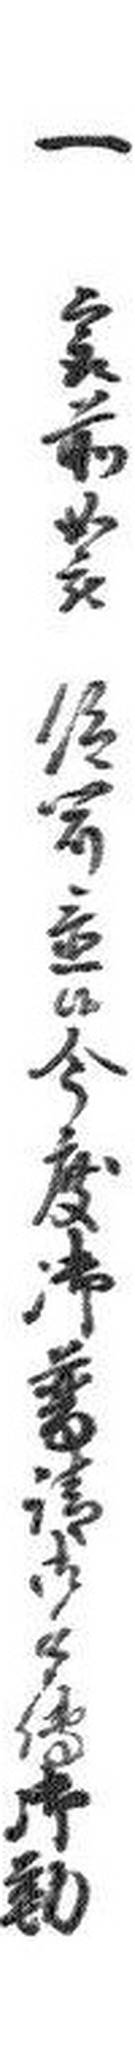一最前如被仰聞置候今度御普請御手伝御勤
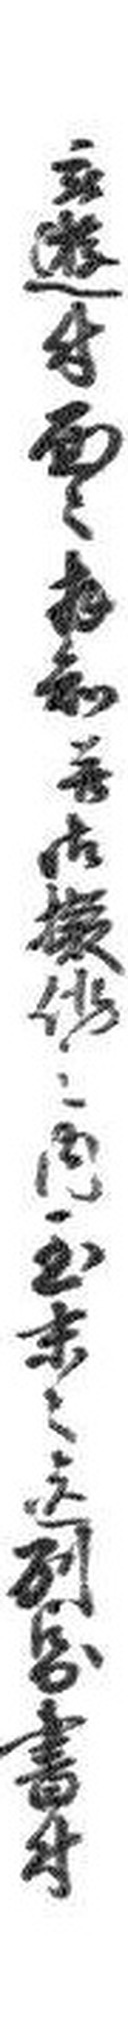被遊付面々拝知并御擬作之内至末々迄別紙書付

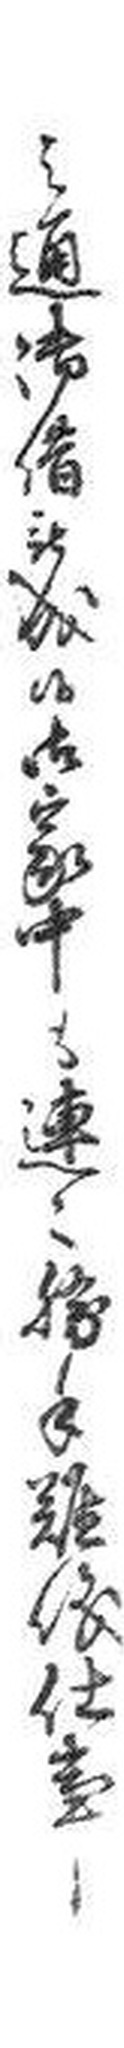之通御借被成候御家中も連々勝手難儀仕事
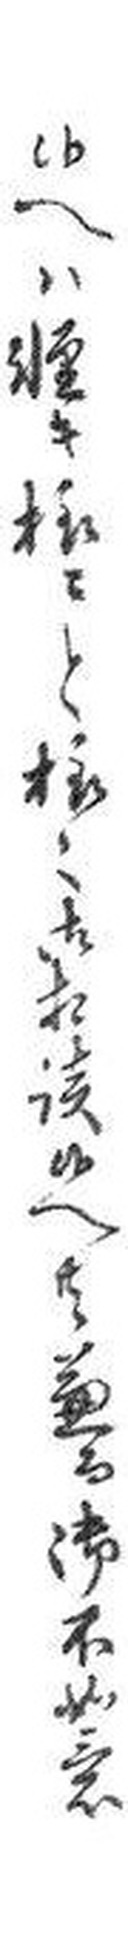候ヘハ軽キ様ニと様々御相談候へ共兼而御不如意
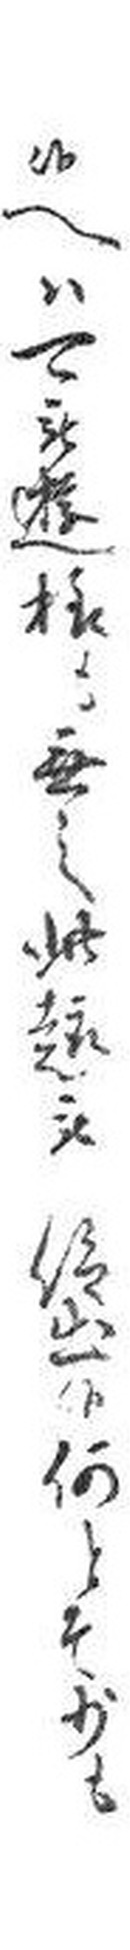候ヘハ可被遊様も無之此趣被仰出候何とそ少も
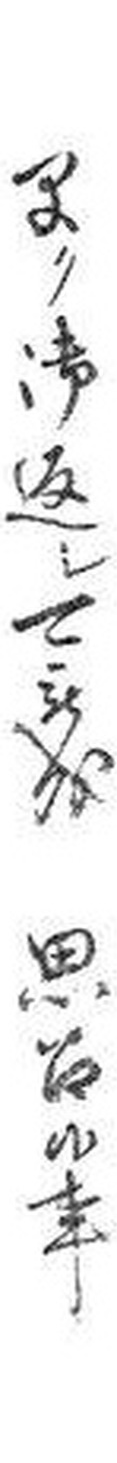早ク御返シ可被成思召候事
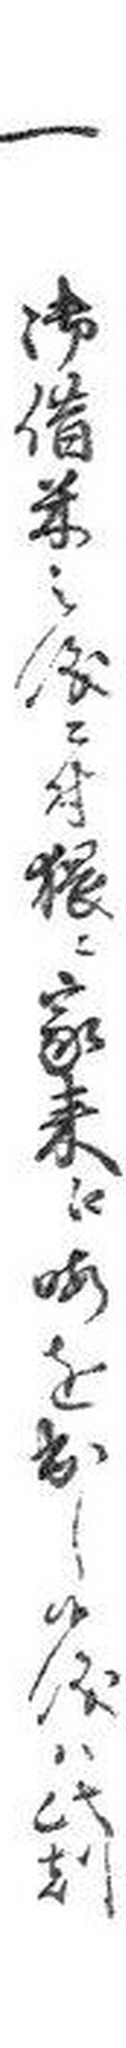一御借米之儀ニ付猥ニ家来江暇を出し候儀ハ此刻
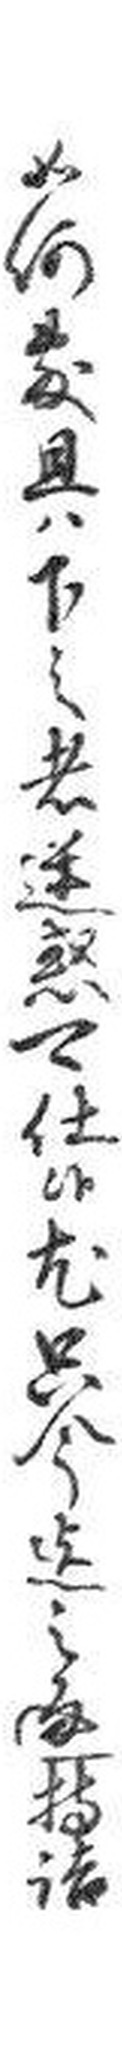如何敷且ハ下之者迷惑可仕候尤只今迄之通持詰
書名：家譜 二十三 吉品公 従宝永元年到同二年
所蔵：福井県文書館 Fukui Prefectural Archives
